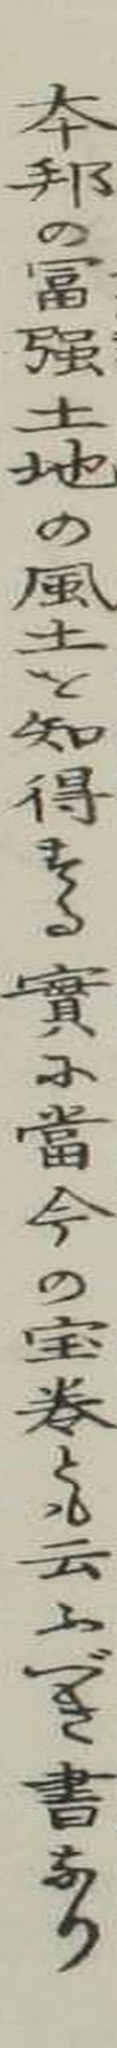本邦の富強土地の風土を知得する実に当今の宝巻とも云ふべき書なり

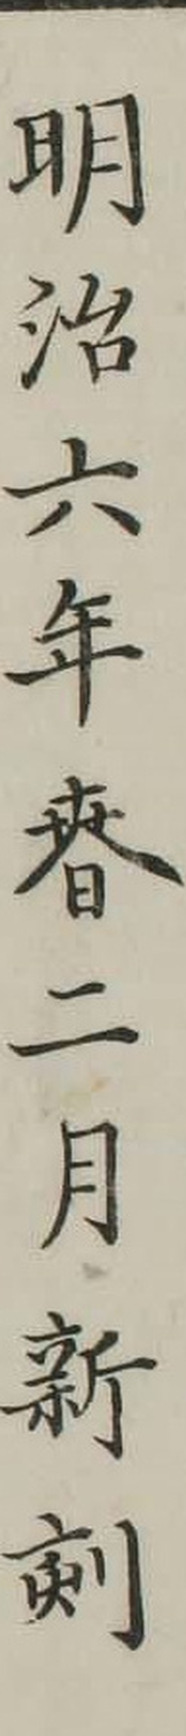明治六年春二月新刊
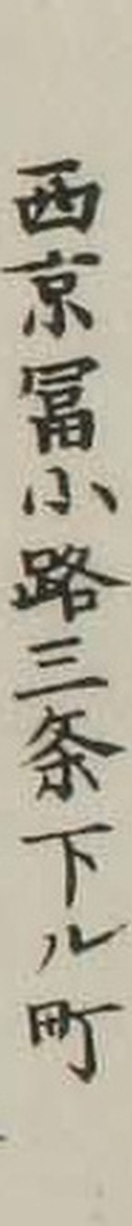西京富小路三条下ル町
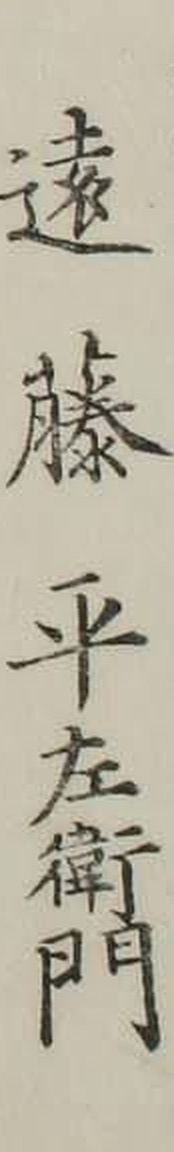遠藤平左衛門
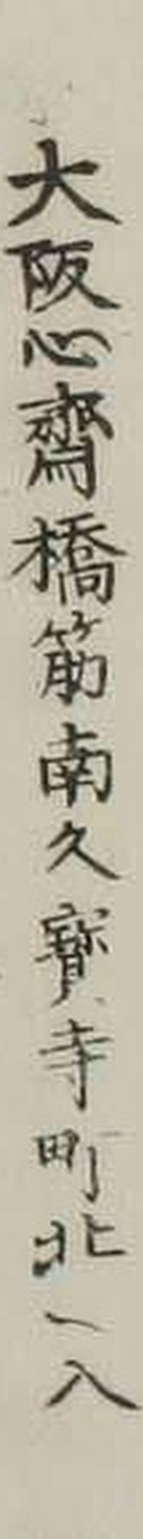大阪心斎橋筋南久宝寺町北ヘ入
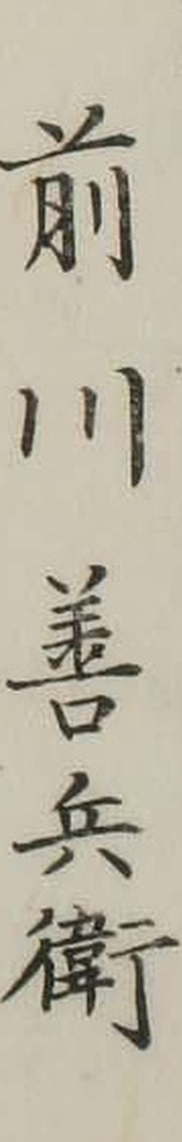前川善兵衛
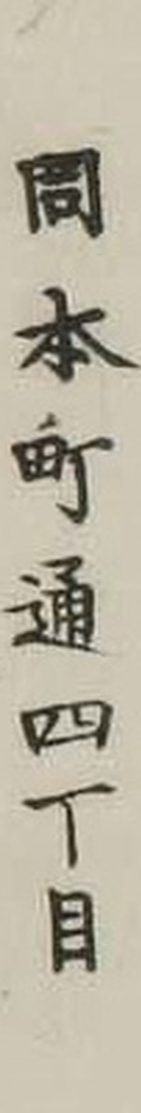同本町通四丁目
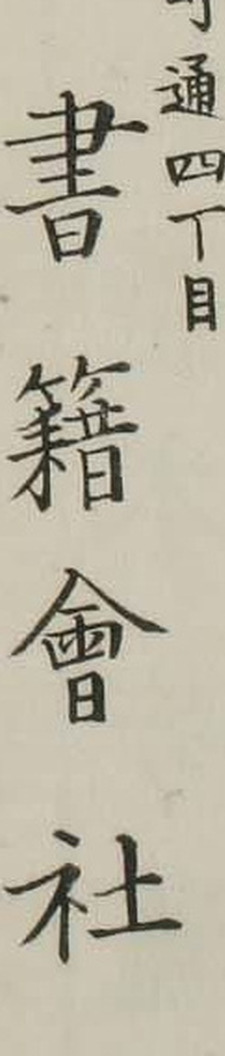書籍会社
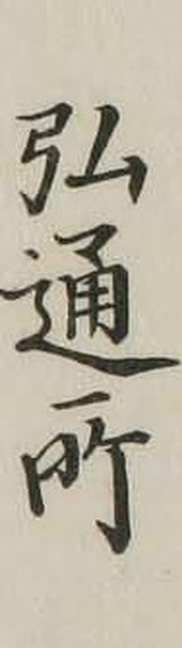弘通所
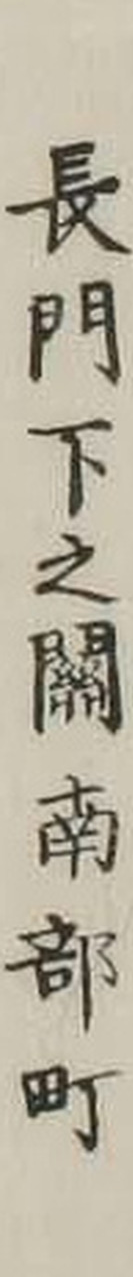長門下之関南部町
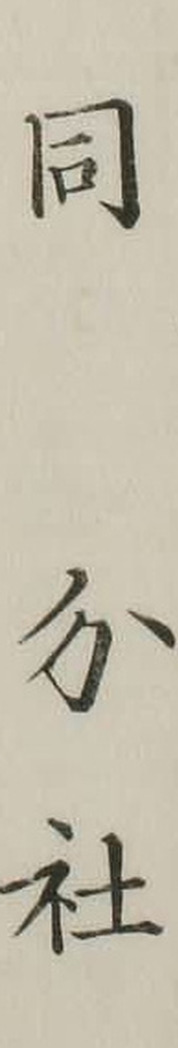同分社
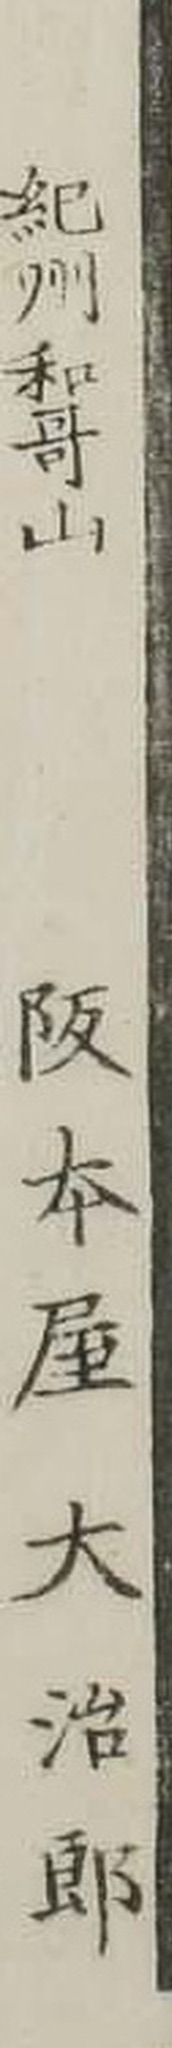紀州和歌山坂本屋大治郎
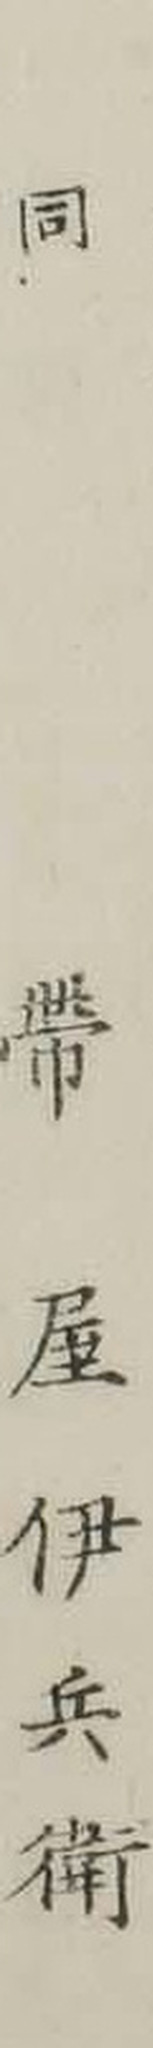同帯屋伊兵衛
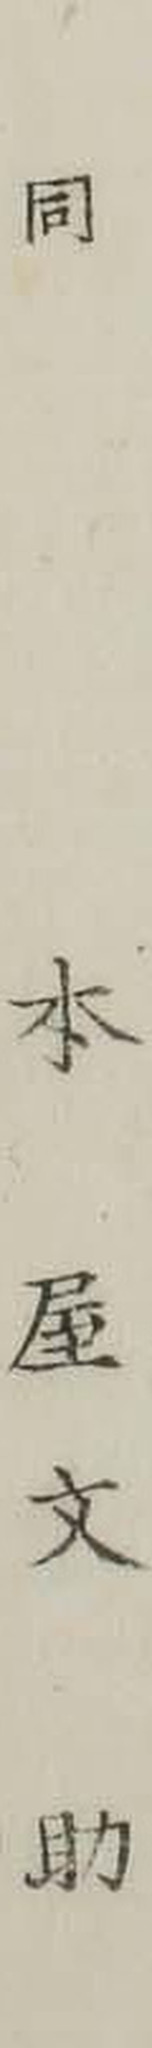同水屋文助
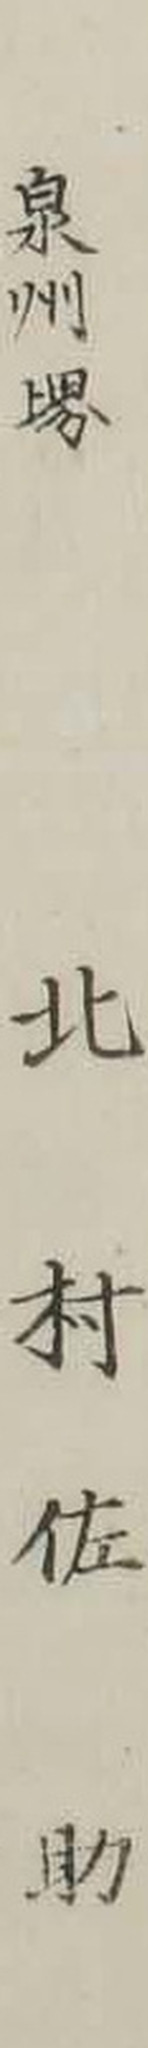泉州堺北村佐助
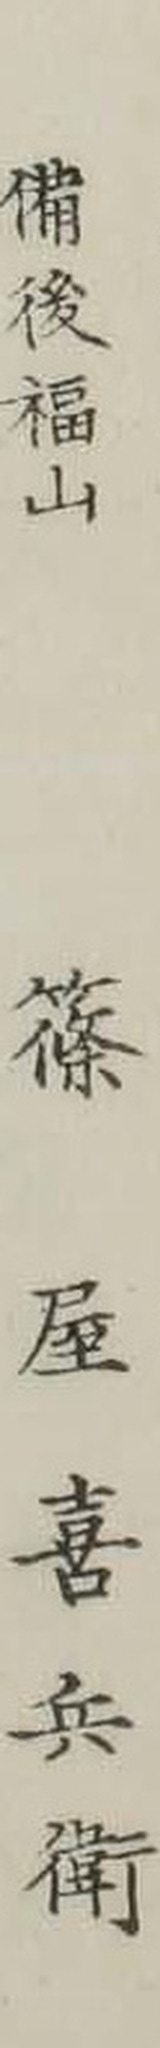備後福山篠屋喜兵衛
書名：開化往来
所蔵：東京学芸大学教育コンテンツアーカイブ
